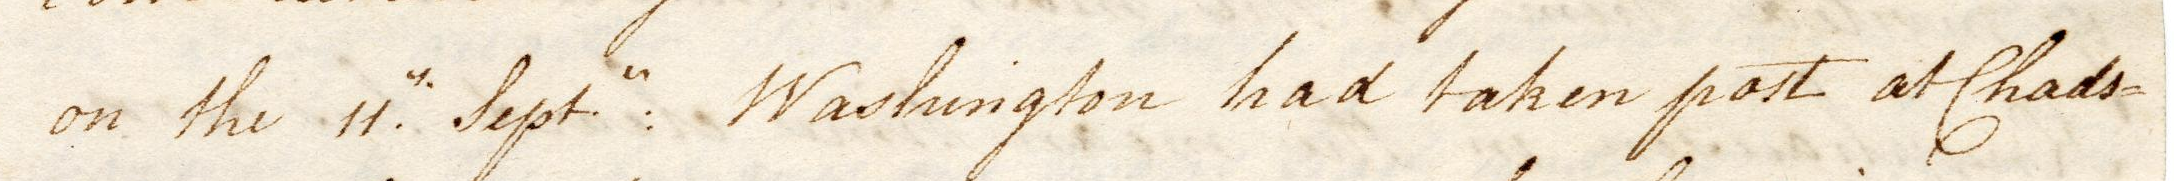on the 11^th. Sept^r: Washington had taken post at Chads-
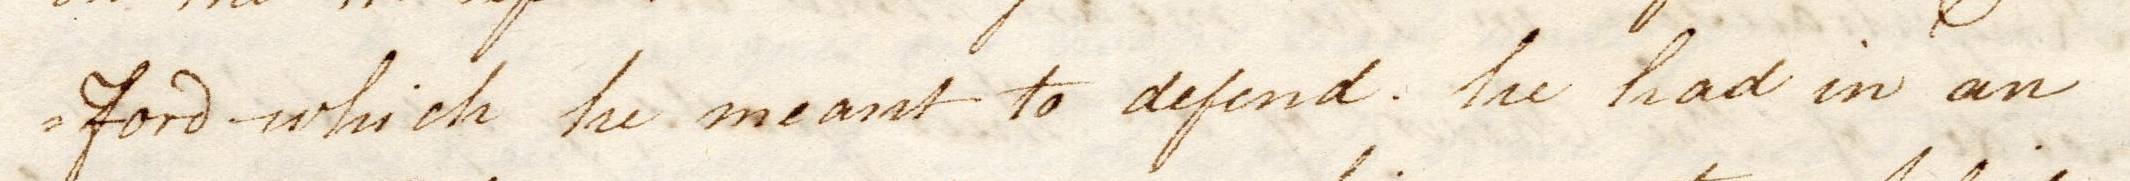-ford which he meant to defend. he had in an
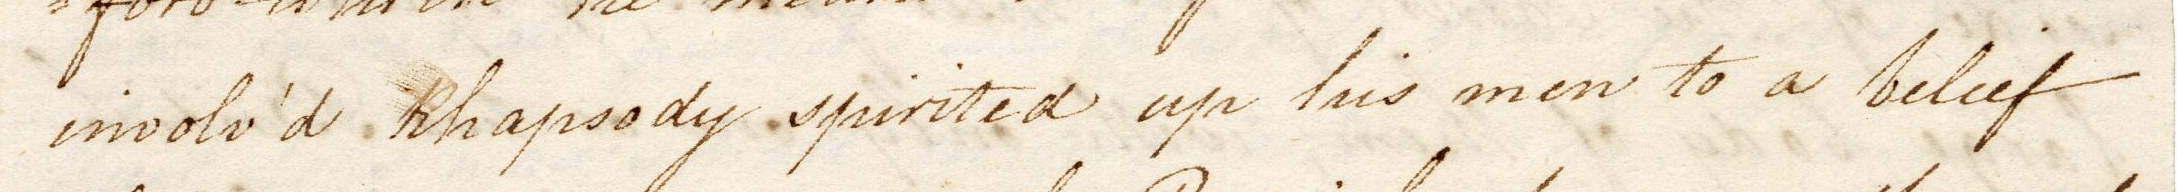involv'd Rhapsody spirited up his men to a belief
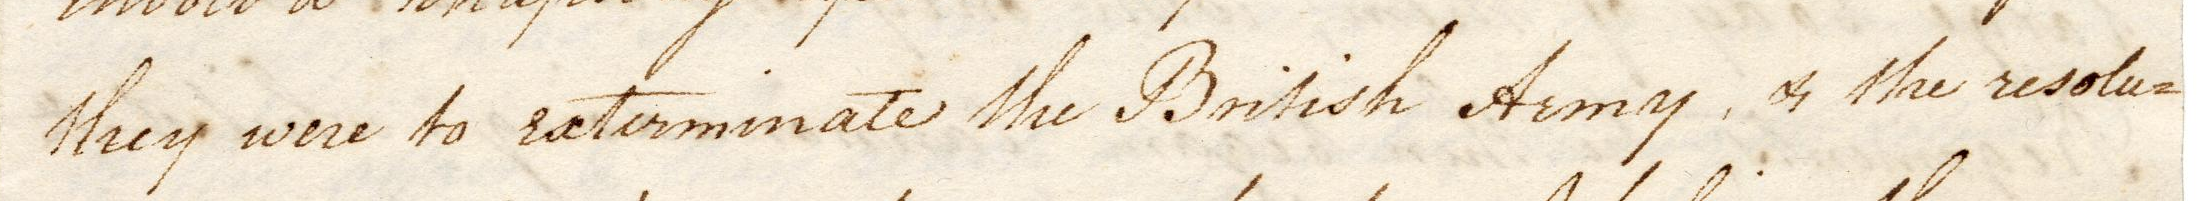they were to exterminate the British Army, & the resolu-
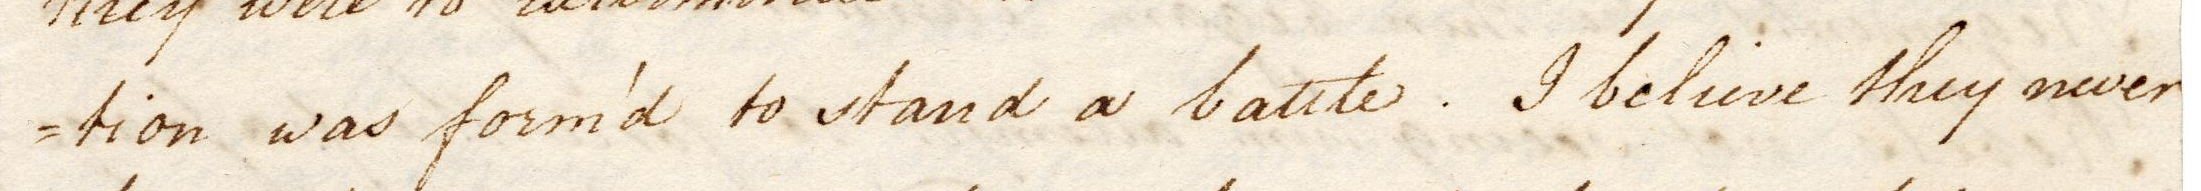-tion was form'd to stand a battle. I believe they never
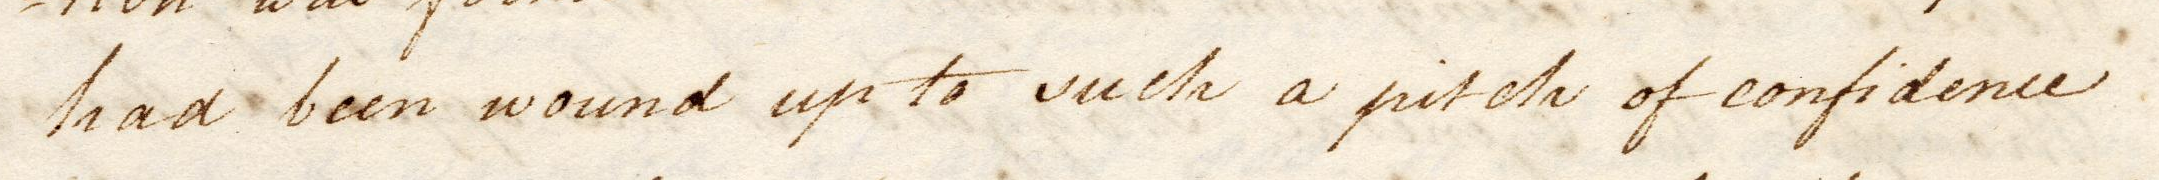had been wound up to such a pitch of confidence
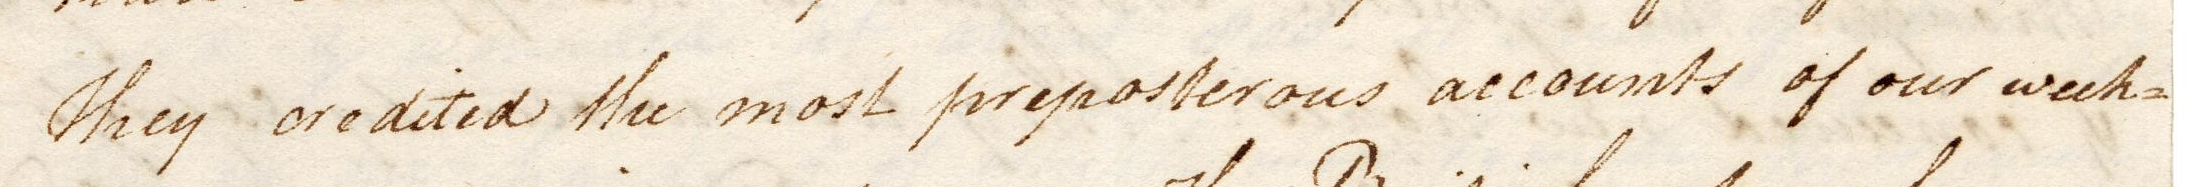they credited the most preposterous accounts of our week-
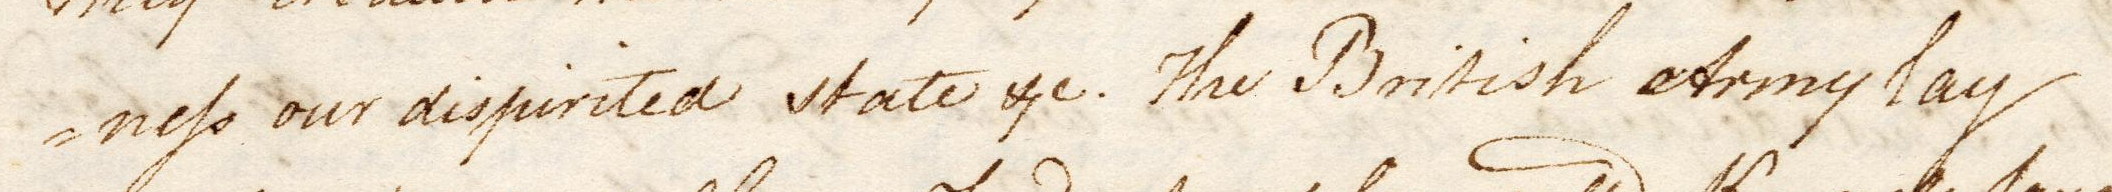-ness our disprited state &c. The British Army lay
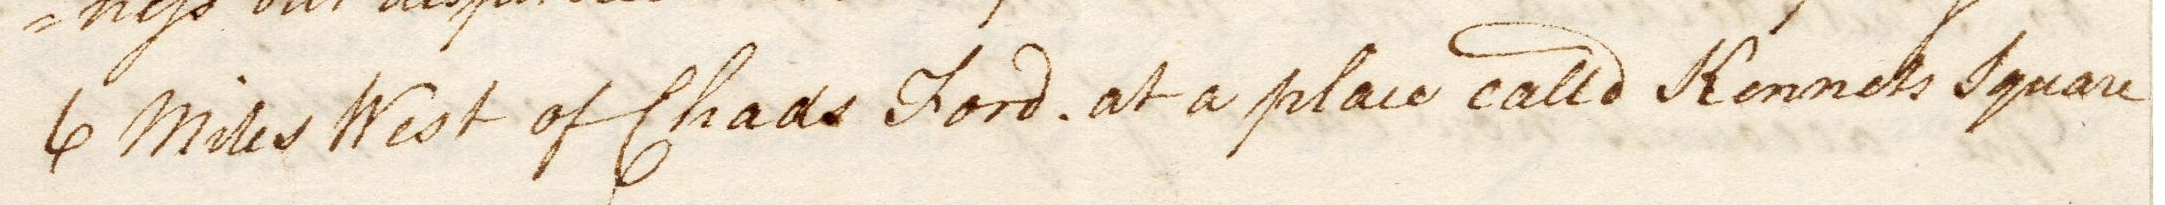6 Miles West of Chadds Ford. at a place calld Kennets Square
